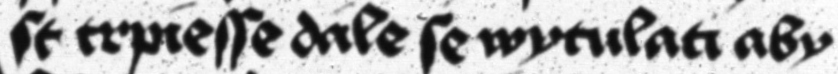ſt trpíeſſe dále ſe wytulati aby
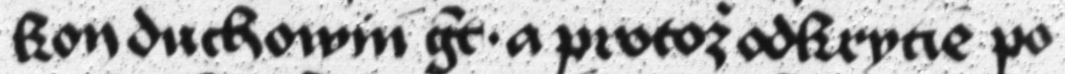kon duchowṅí ḡt. a protoż odkrytie po
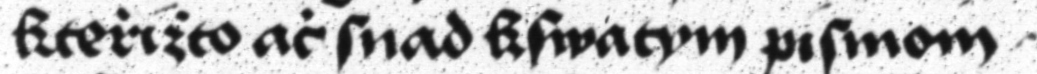kteṙíżto aċ ſnad k ſwatym piſmom
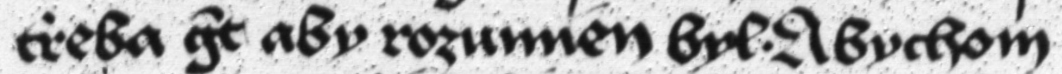ṙteba ḡt aby rozumíen byl.Abychom
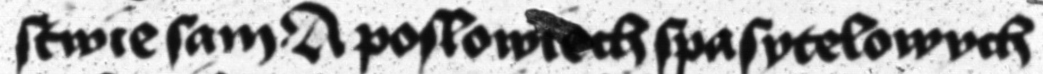ſtwíe ſam. A poſlowíech ſpaſytelowych
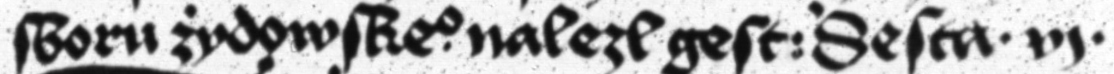ſboru żydowske° nalezl geſt: Ṡestá. vi
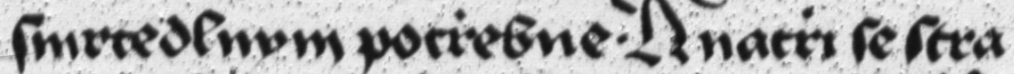ſmrtedlnym potṙebne. A natṙi ſe ſtra
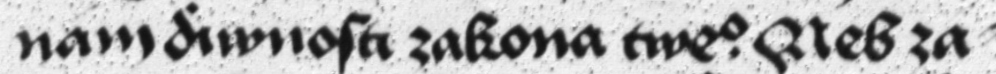nám diwnoſti zakona twe° Neb za
